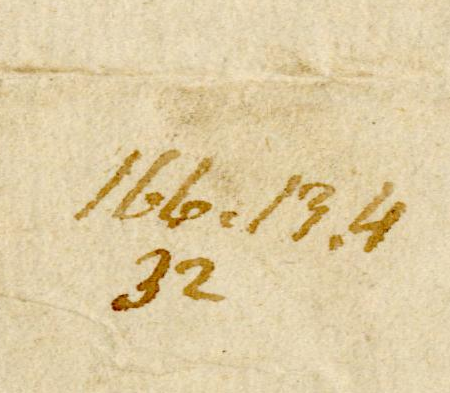166.13.4
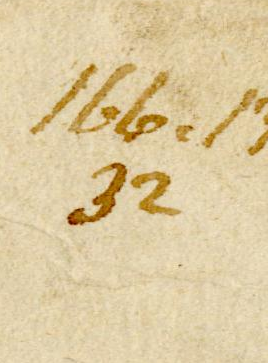32
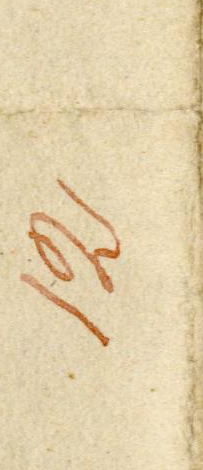12
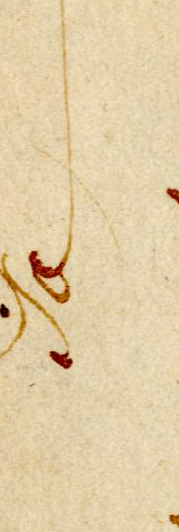To
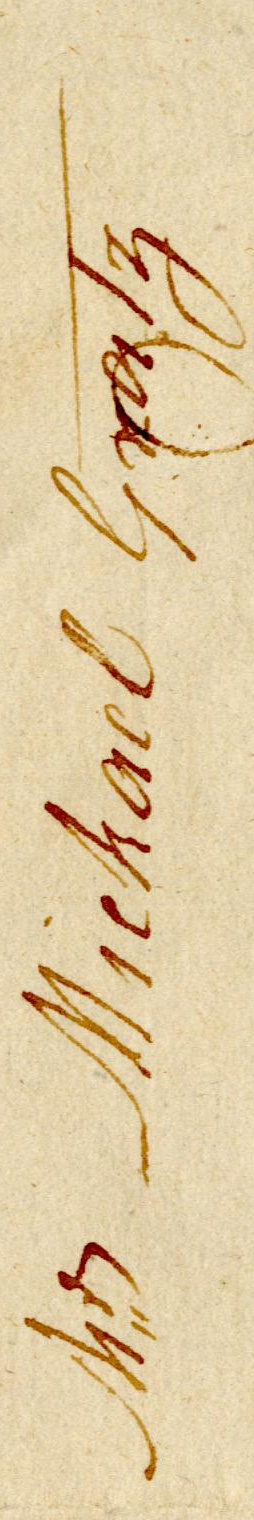M^r Michael Gratz
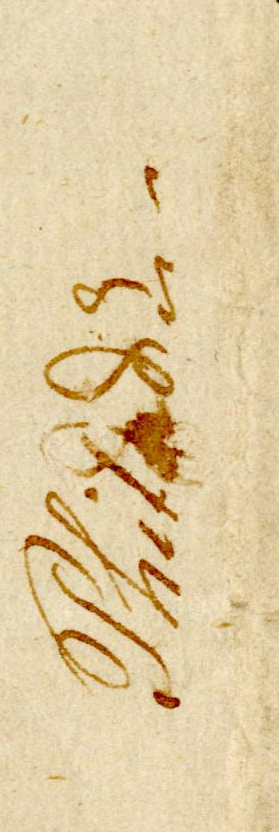Phila^a
